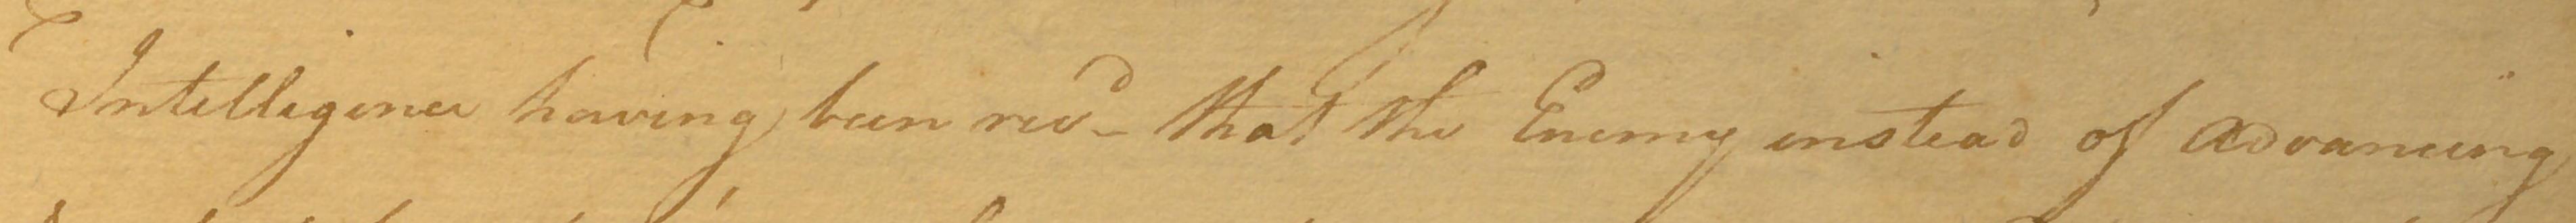Intelligence having been rec^d- that the Enemy instead of advancing
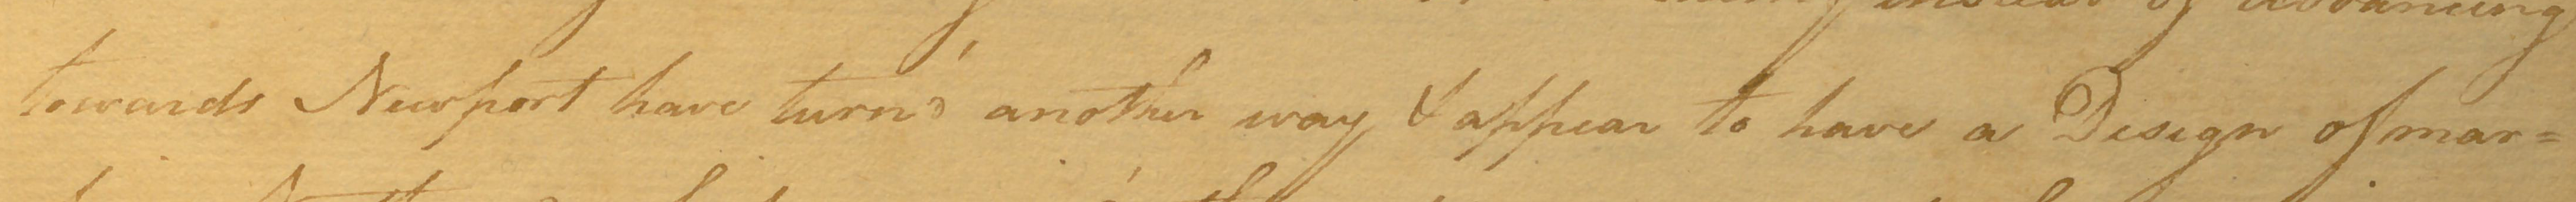towards Newport have turn'd another way & appear to have a Design of mar-
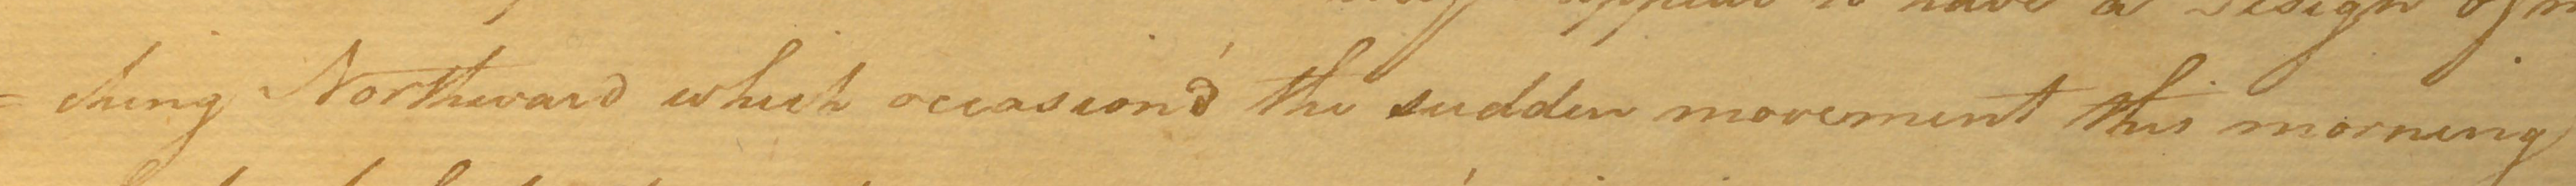-ching Northward which occasion'd the sudden movement this morning
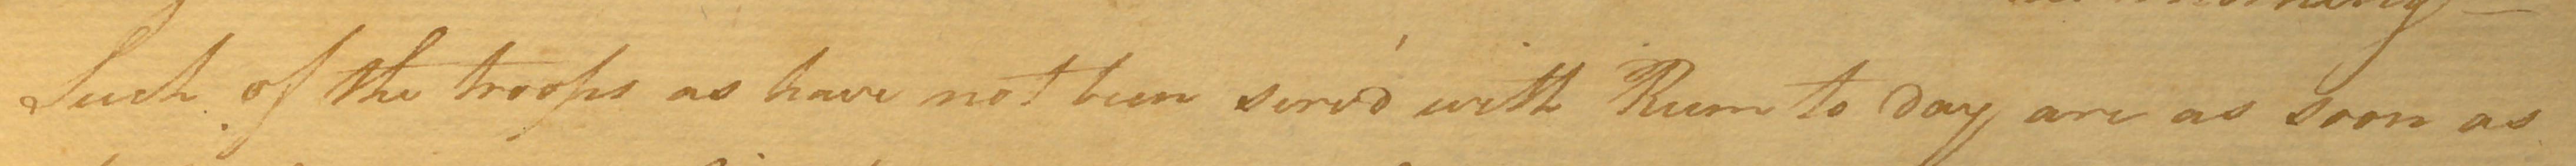Such of the troops have not been serv'd with Rum to day are as soon as
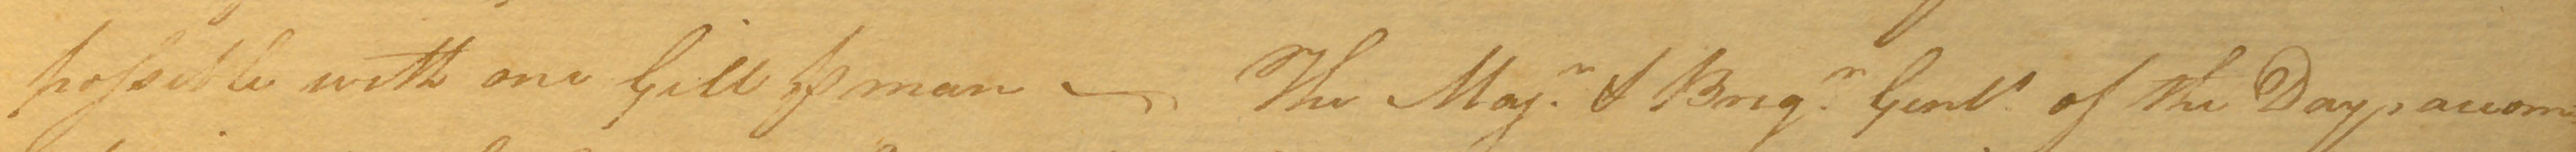possible with one Gill per man- The Maj^r. & Brig^r. Gen^l. of the Day, accom
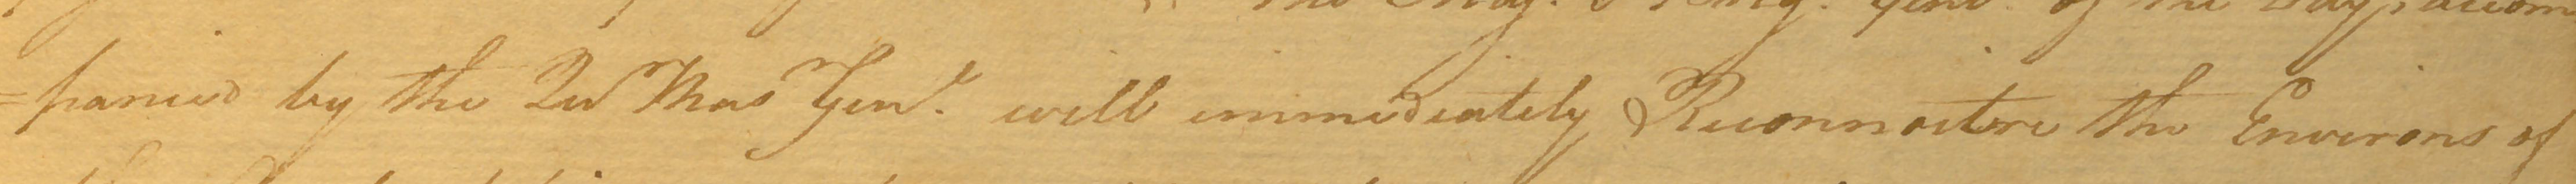panied by the Qu^r Mas^r Gen^l. will immediately Reconnoitre the Environs of
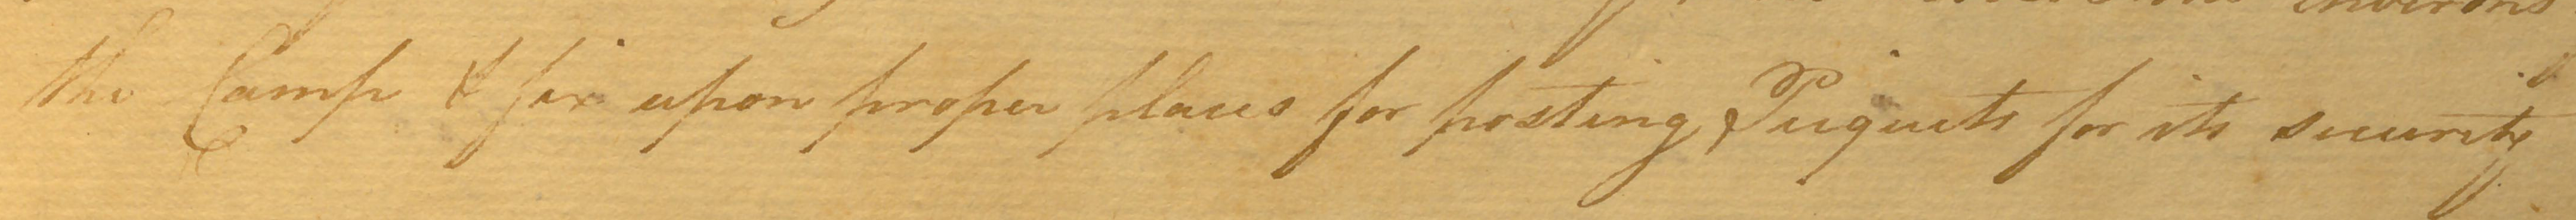the Camp & fix upon proper places for posting Picquets for its security
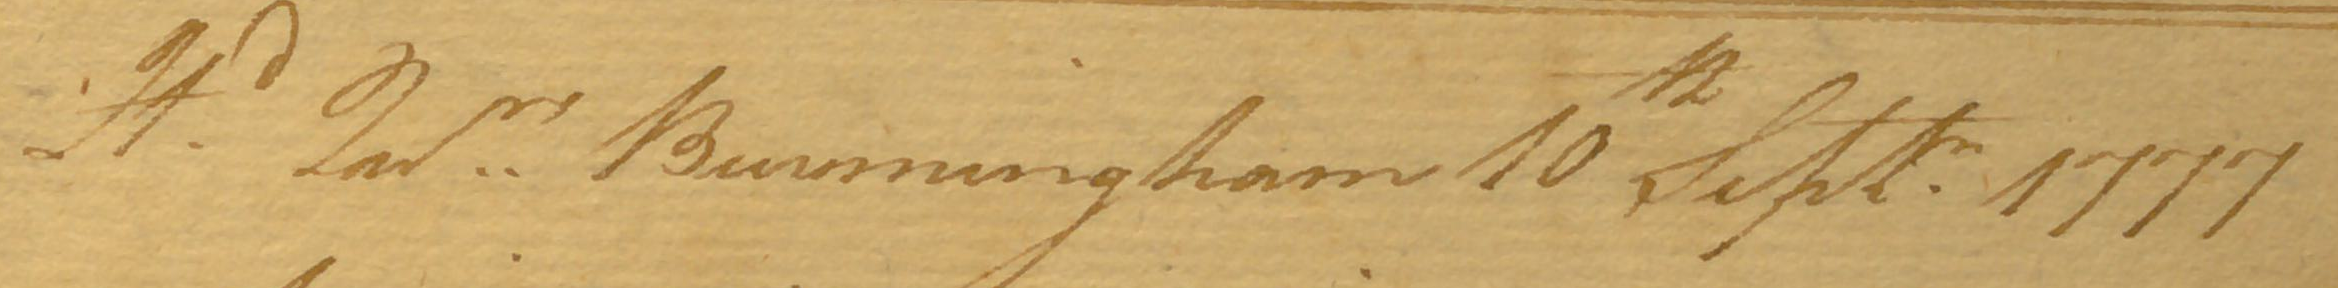H^d. Qu^rs. Burmingham 10^th Sept^r. 1777
